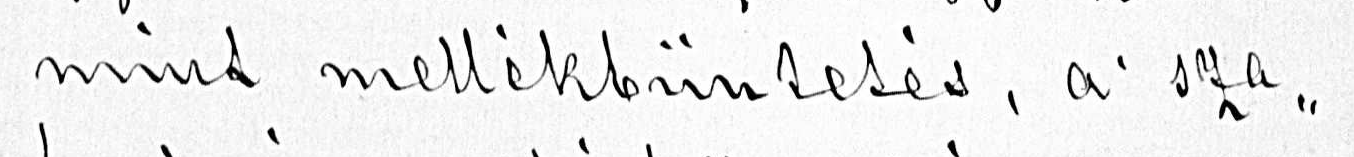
mint mellékbüntetés, a' sza¬
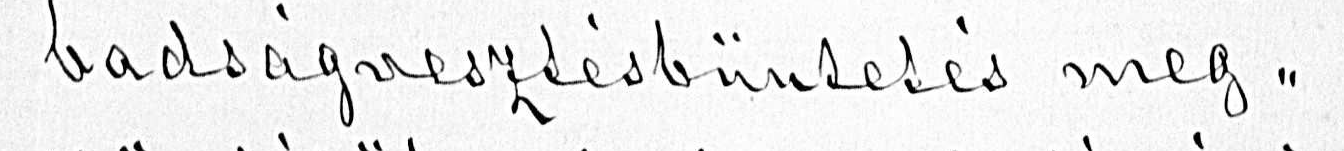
badságvesztésbüntetés meg¬
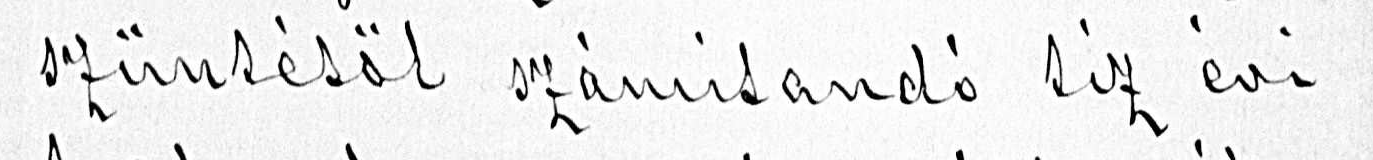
szüntátöl számitandó tiz évi
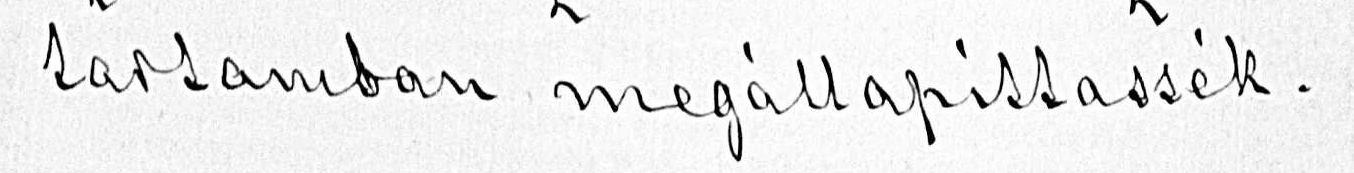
tartamban megállapittassék.
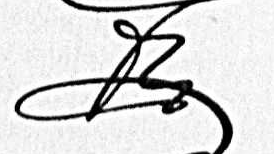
xx
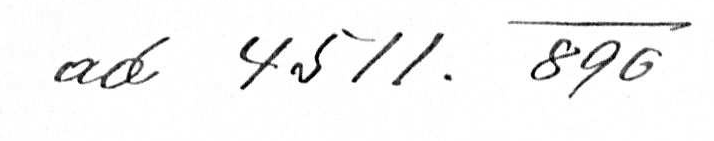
ad 4511. 890
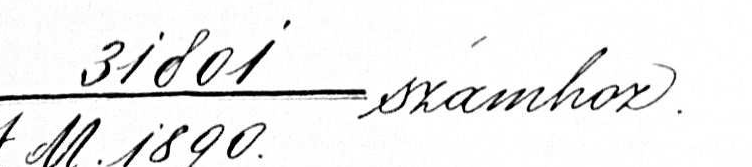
31801 számhoz.
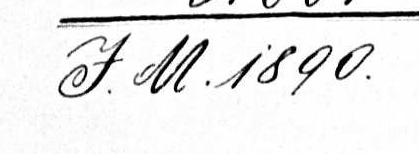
J. M. 1890
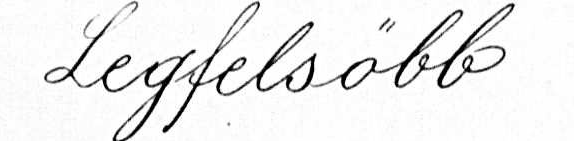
Legfelsöbb
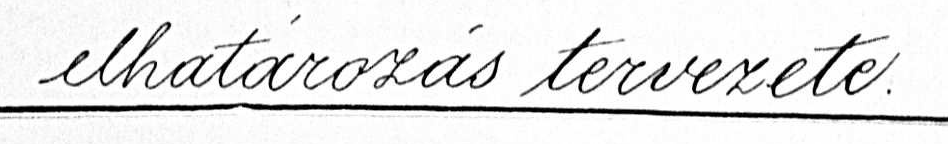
elhatározás tervezete.
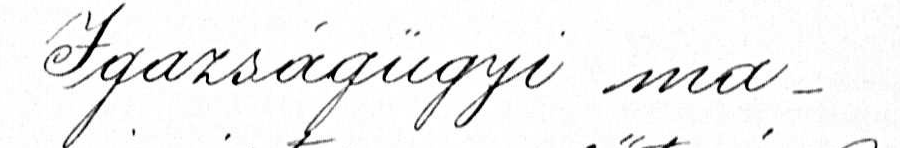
Jgazságügyi ma¬
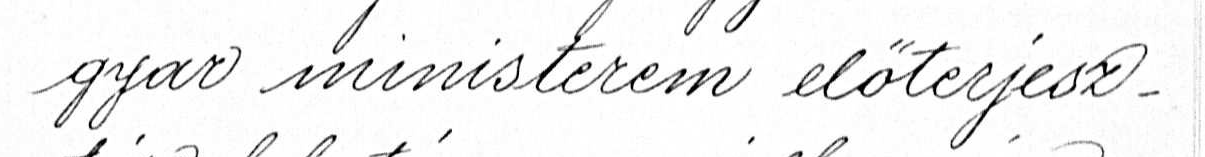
gyar ministerem elöterjesz¬
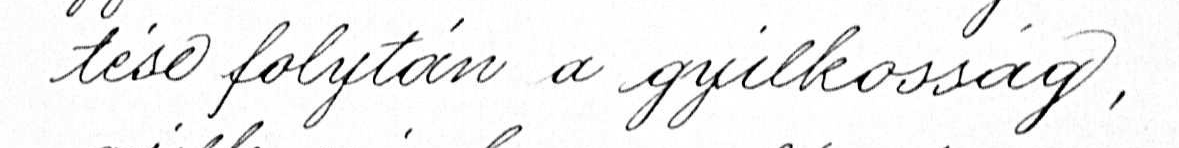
tése folytán a gyilkosság,
